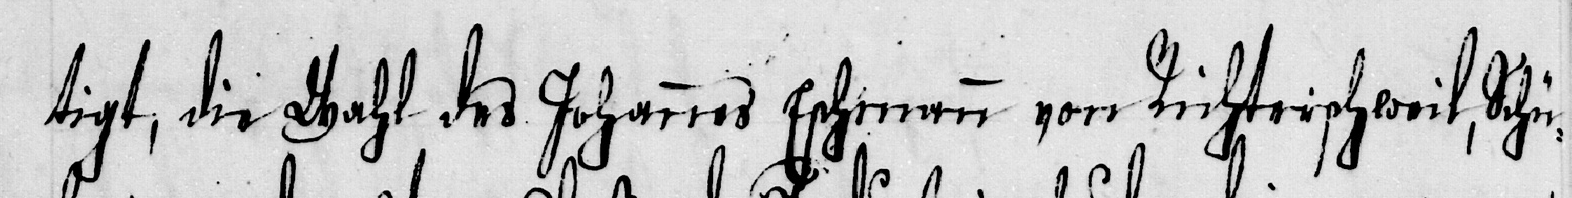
tigt, die Wahl des Johannes Eschmann von Richterschweil, Sc¬
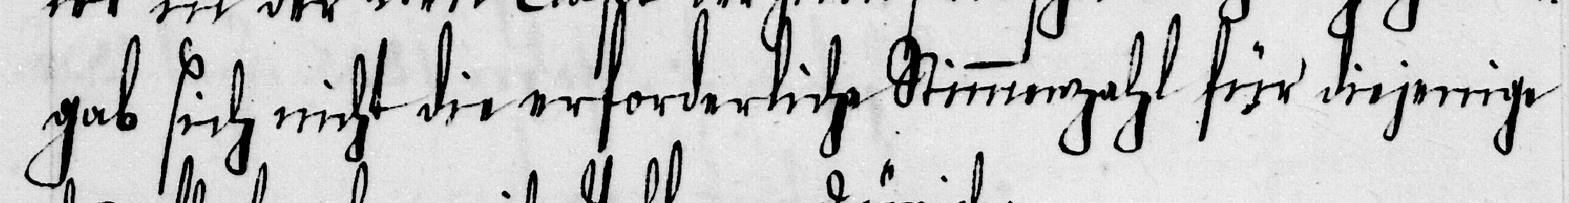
gab sich nicht die erforderliche Stimmenzahl für diejenige
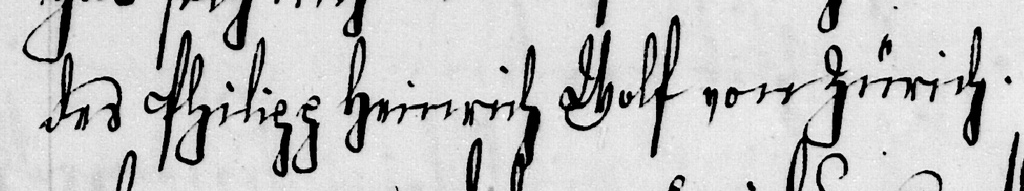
des Philipp Heinrich Wolf von Zürich.
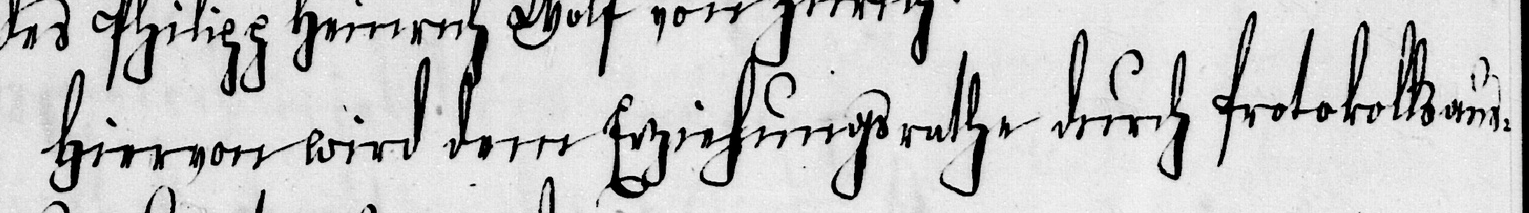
Hiervon wird dem Erziehungsrathe durch Protokollsa¬
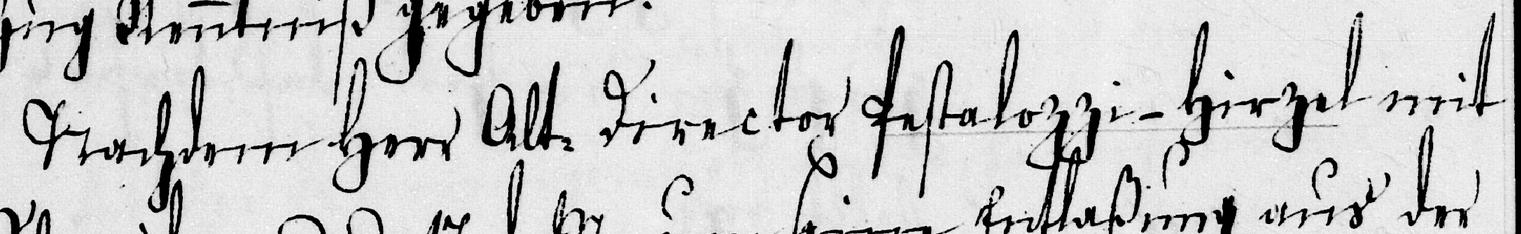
Nachdem Herr Alt-Director Pestalozzi-Hirzel mit
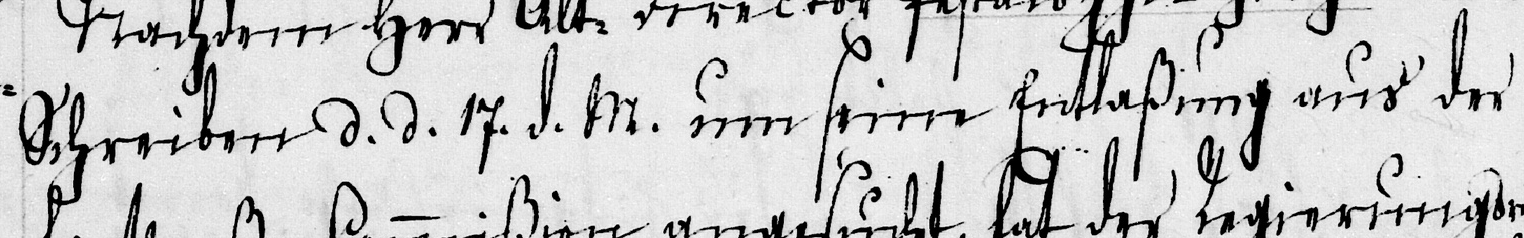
Schreiben d. d. 17. d. M. um seine Entlaßung aus der
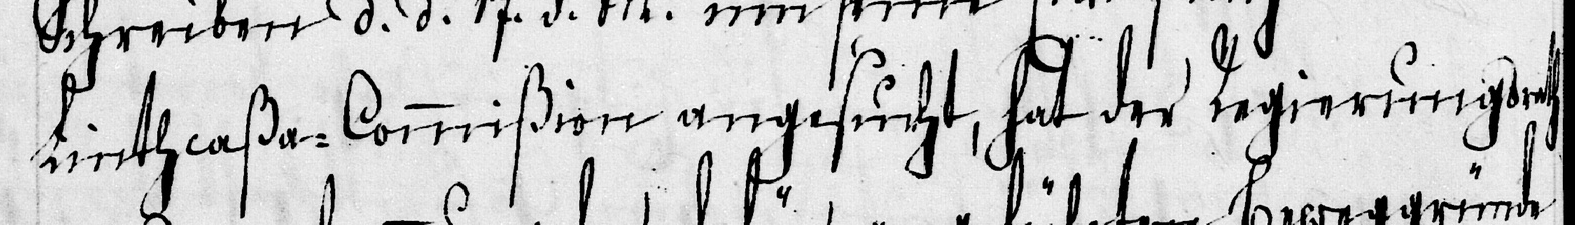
Linthcaßa-Commißion angesucht, hat der Regierungsrath
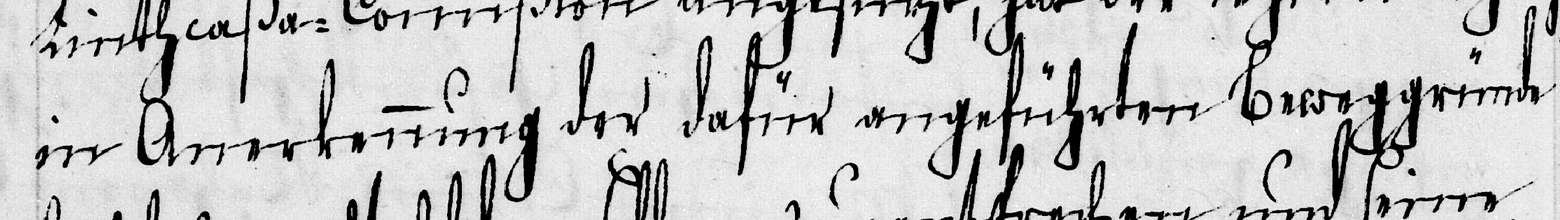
in Anerkennung der dafür angeführten Beweggründe
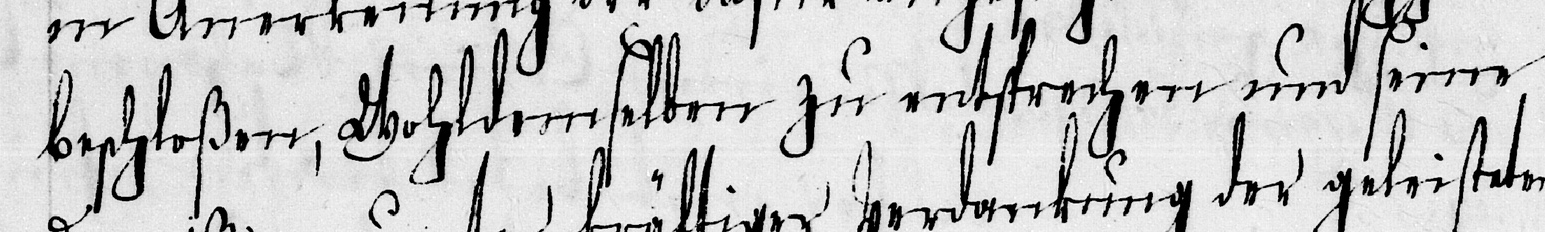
beschloßen, Wohldemselben zu entsprechen und seine
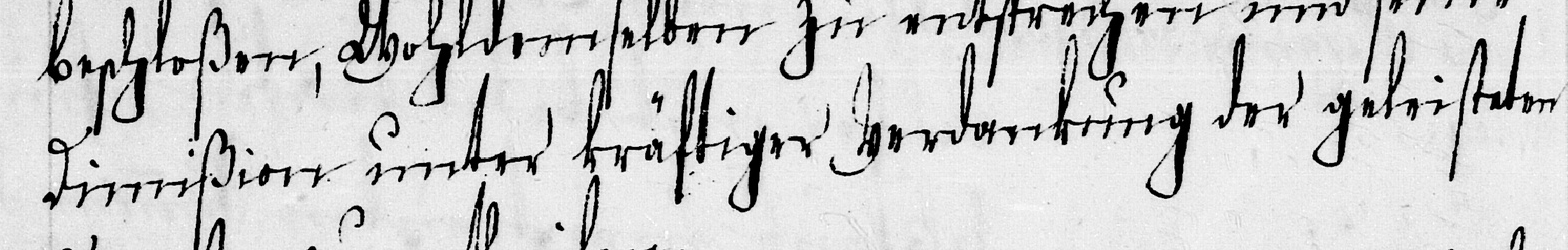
Dimißion unter kräftiger Verdankung der geleisteten
